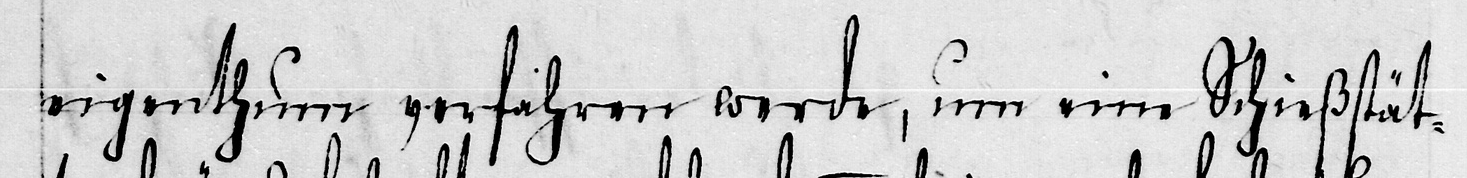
eigenthum verfahren werde, um eine Schießstät¬
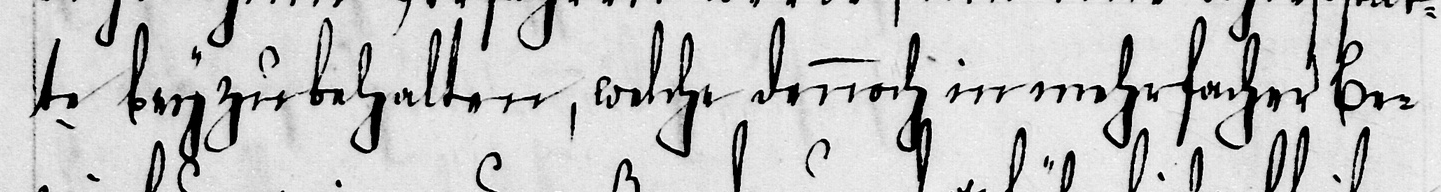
te beyzubehalten, welche dennoch in mehrfacher Be¬
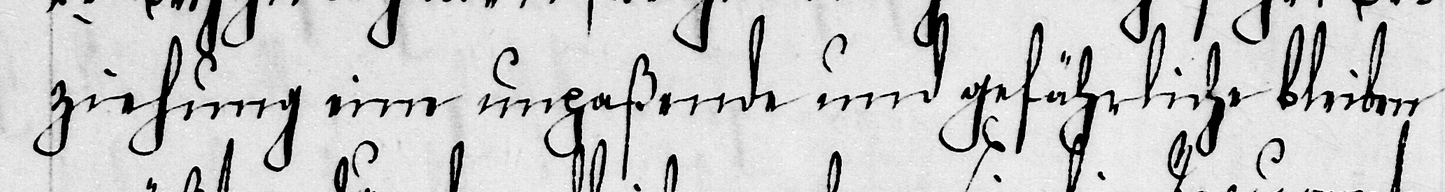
ziehung eine unpaßende und gefährliche bleiben
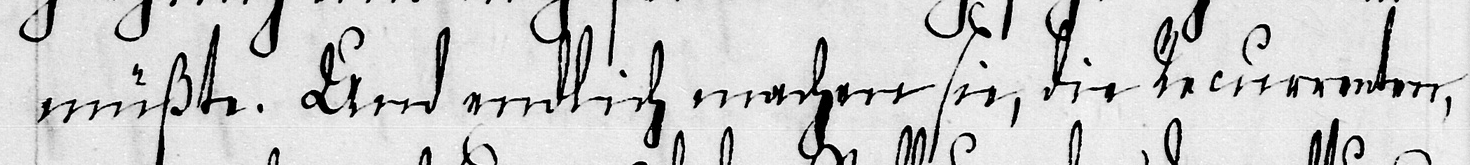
müßte. Und endlich machen sie, die Recurrenten,
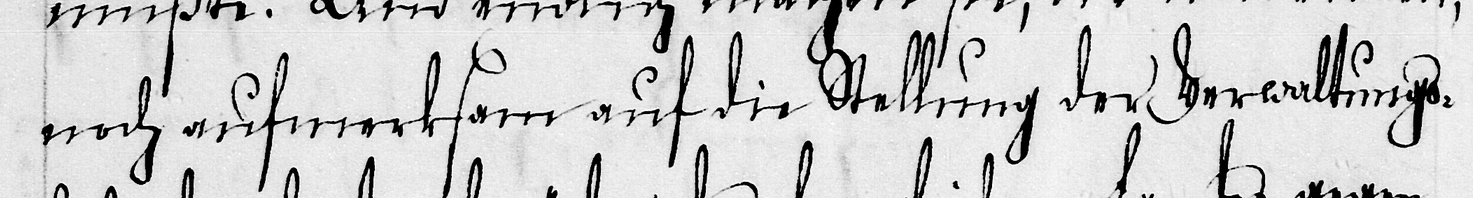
noch aufmerksam auf die Stellung der Verwaltungs¬
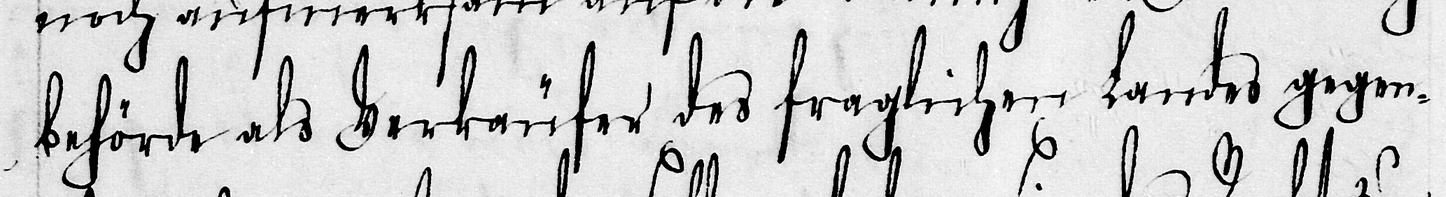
behörde als Verkäufer des fraglichen Landes gegen¬
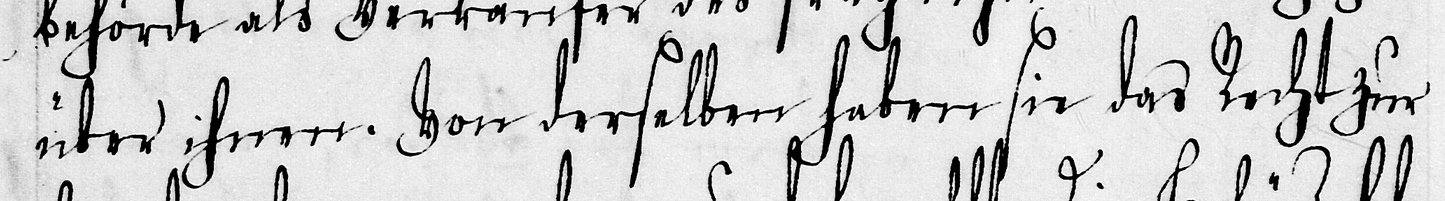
über ihnen. Von derselben haben sie das Recht zur
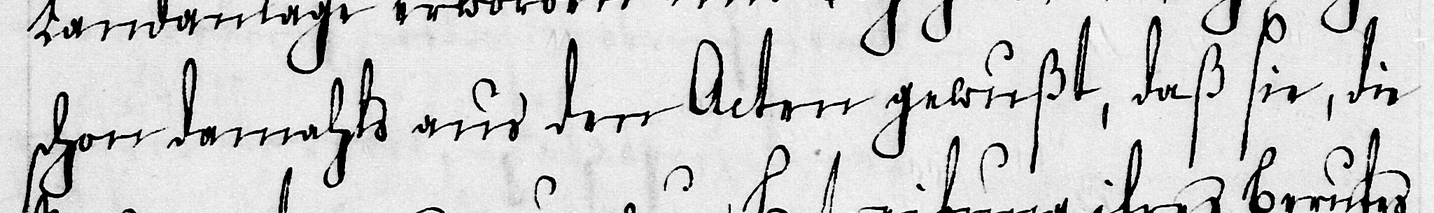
schon damahls aus den Acten gewußt, daß sie, die
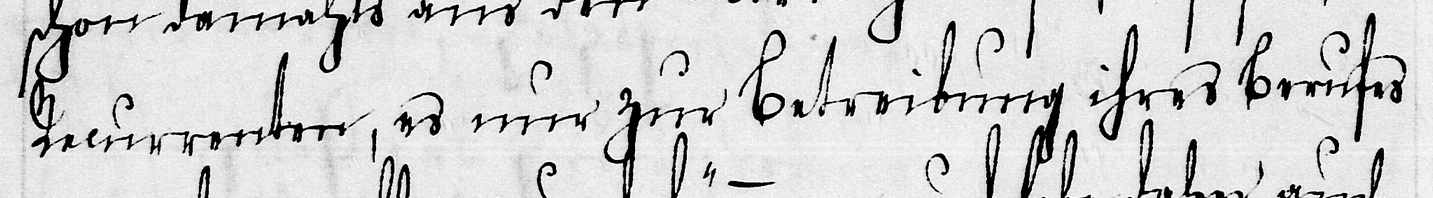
Recurrenten, es nur zur Betreibung ihres Berufes
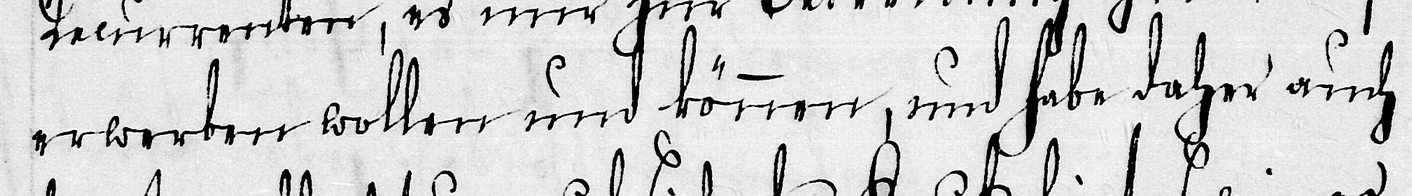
erweben wollen und können, und habe daher auch
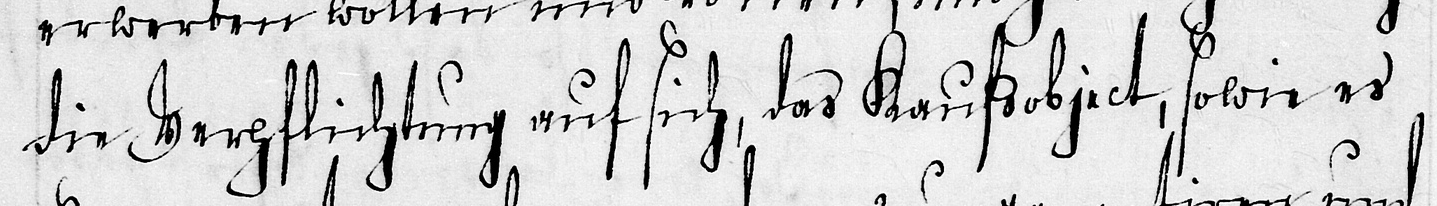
die Verpflichtung auf sich, das Kaufsobject, sowie es
